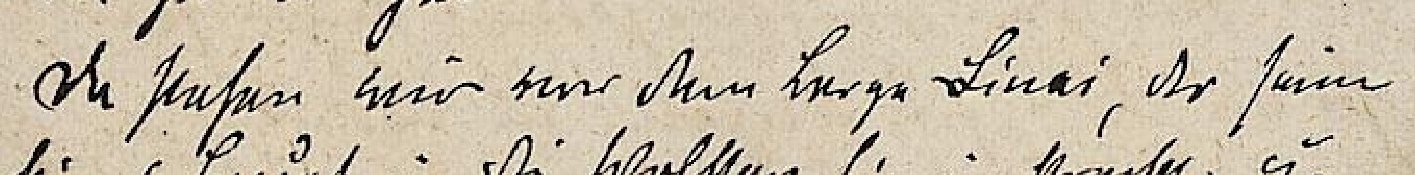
Da stehen wir vor dem Berge Sinai, der sein
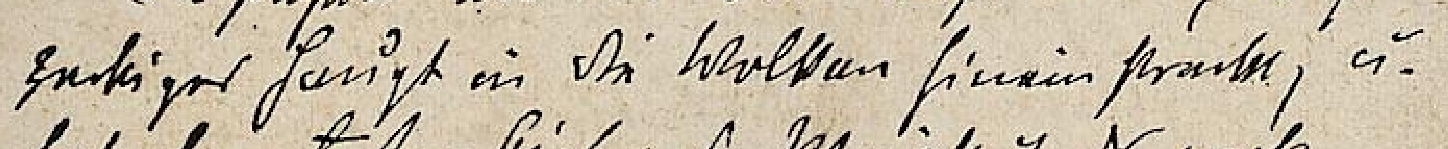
zotiges Haupt in die Wolken hinein streckt, u.
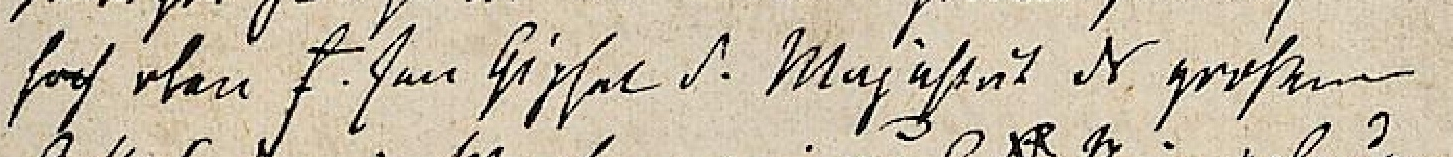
hoch oben f sen Gipfel d. Majestät ds großen
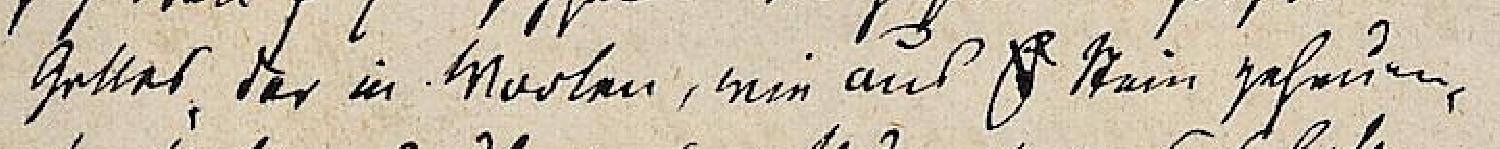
Gottes, der in Worten, wie aus E Stein gehauen,
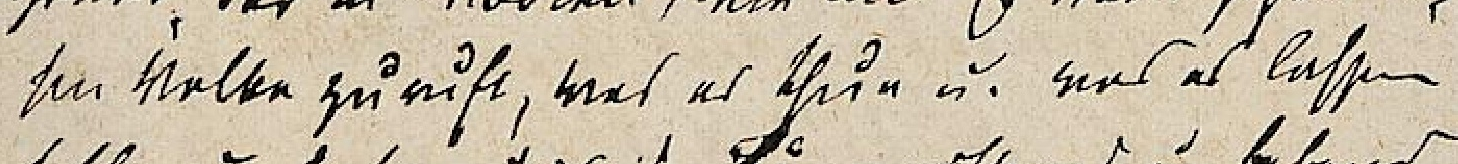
sm Volke zuruft, wes es thun u. was es lassen
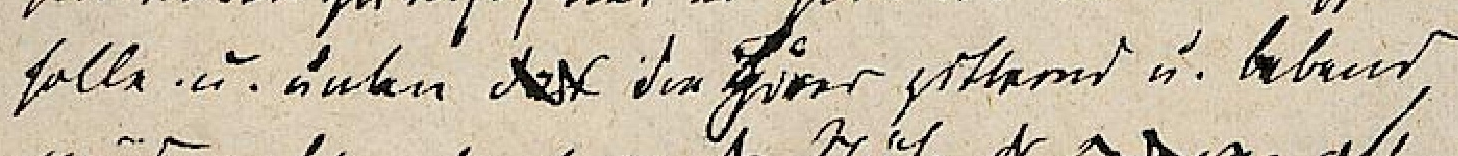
solle u. unten das den Hörer zitternd u. bebend
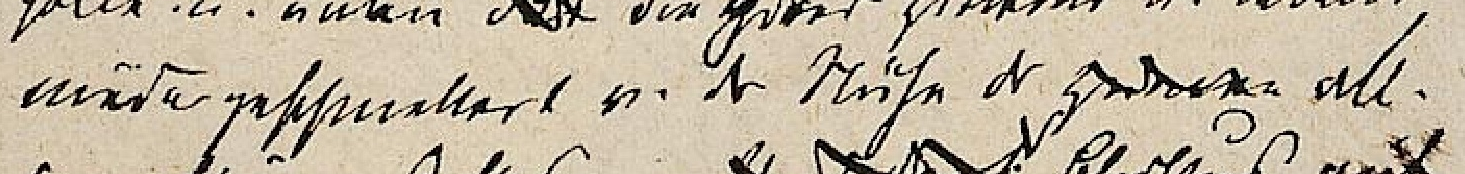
niedergeschmettert v dr Nähe ds zune all¬
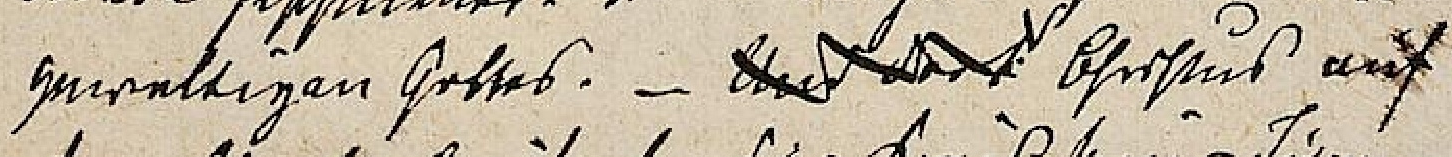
gewaltligen Gottes. _ Und dort Christus auf
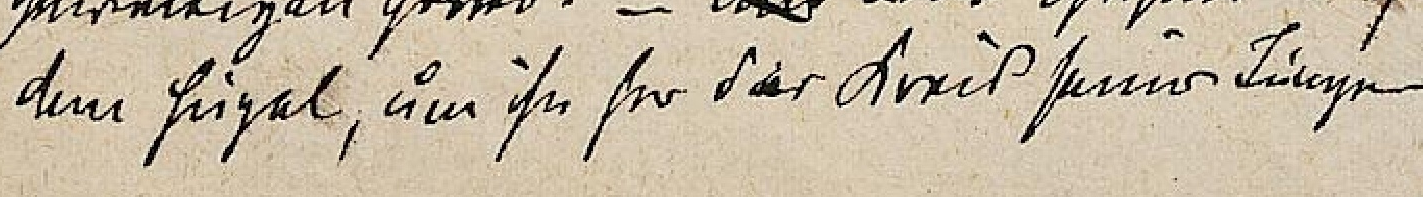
dem Hügel, um ihn her der Kreis seiner Jünger
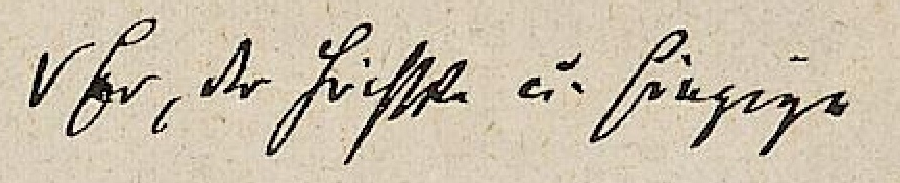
V Er, dr Höchste u. Einzige
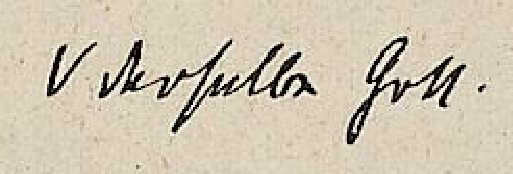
V derselbe Gott.
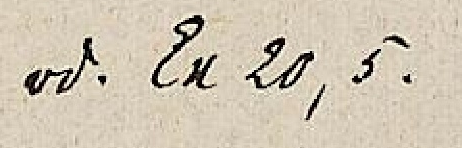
od. Ex 20,5
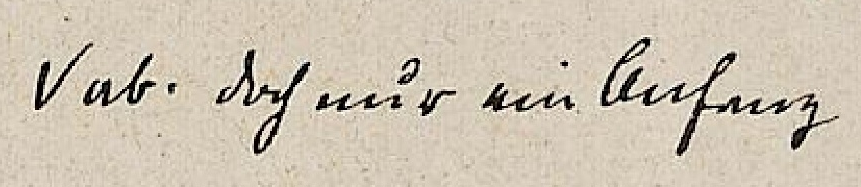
V ab. doch nur ein Anfang
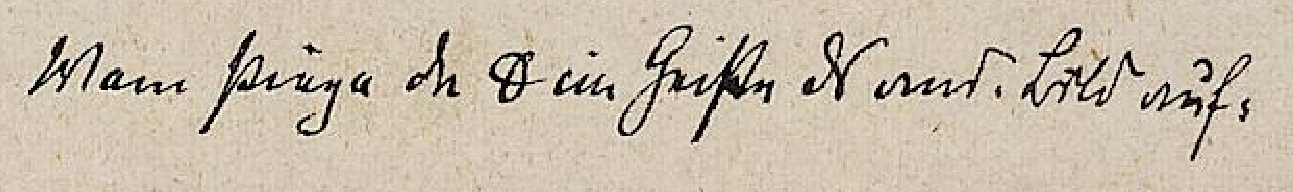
Wen stiege da o im Geiste ds and. Bild auf.
